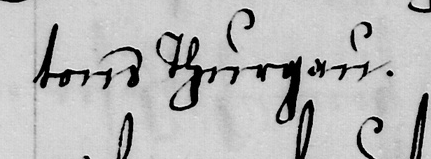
tons Thurgau.
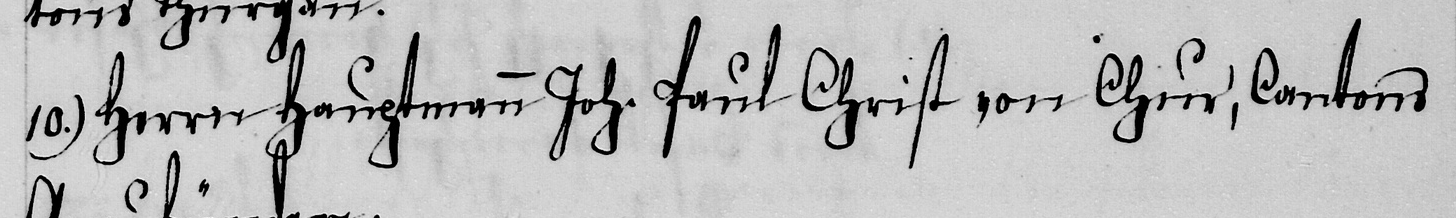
10.) Herrn Hauptmann Joh. Paul Christ von Chur, Cantons
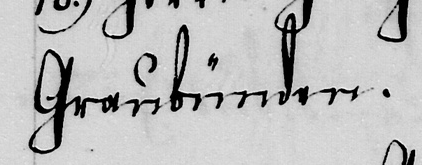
Graubünden.
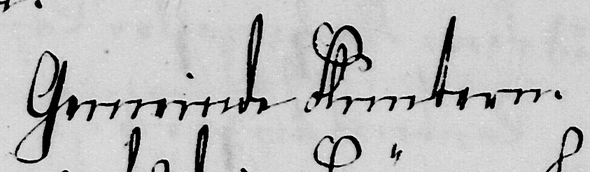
Gemeinde Fluntern.
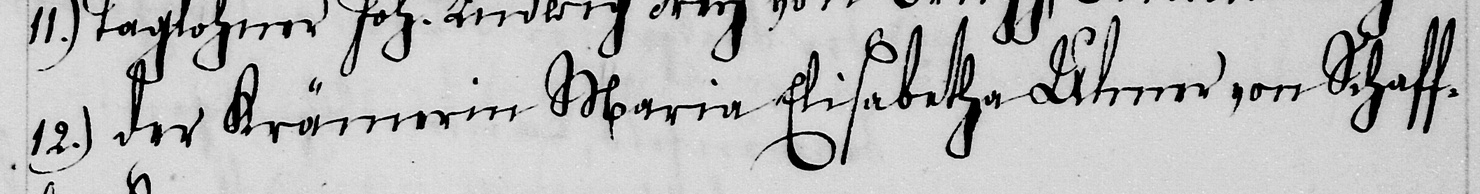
12.) der Krämerin Maria Elisabetha Ulmer von Schaff¬
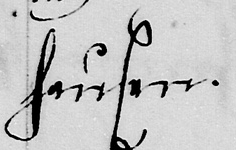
hausen.
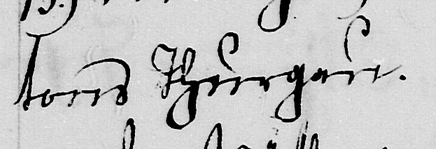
tons Thurgau.
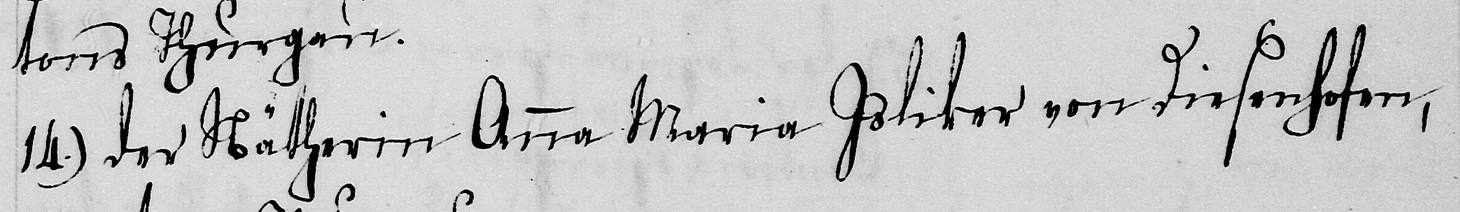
14.) der Nätherin Anna Maria Isliker von Diesenhofen,
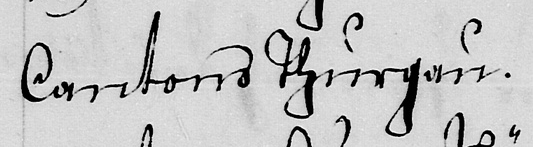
Cantons Thurgau.
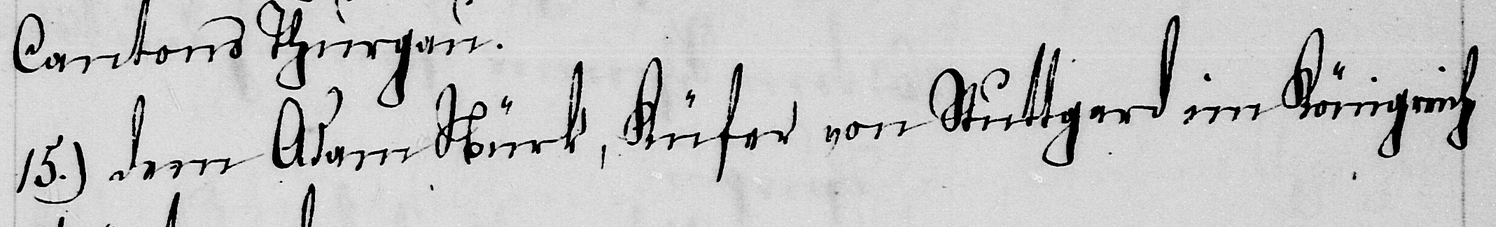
15. dem Adam Nürk, Küfer von Stuttgard im Königreich
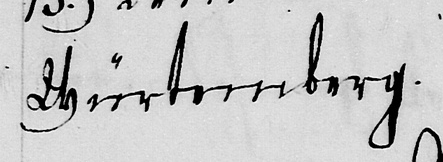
Würtemberg.
